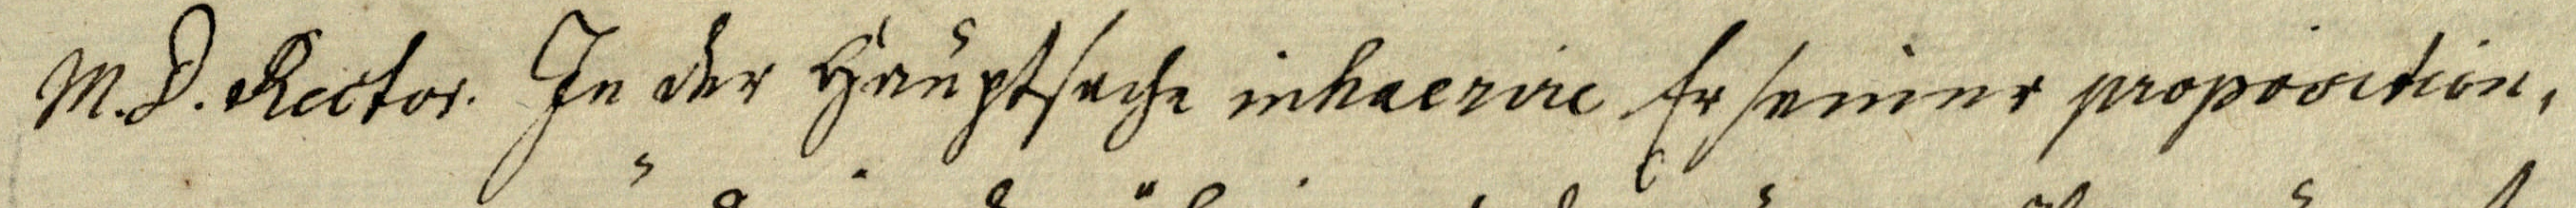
M. D. Rector. In der Hauptsache inhaerire Er seiner proposition,
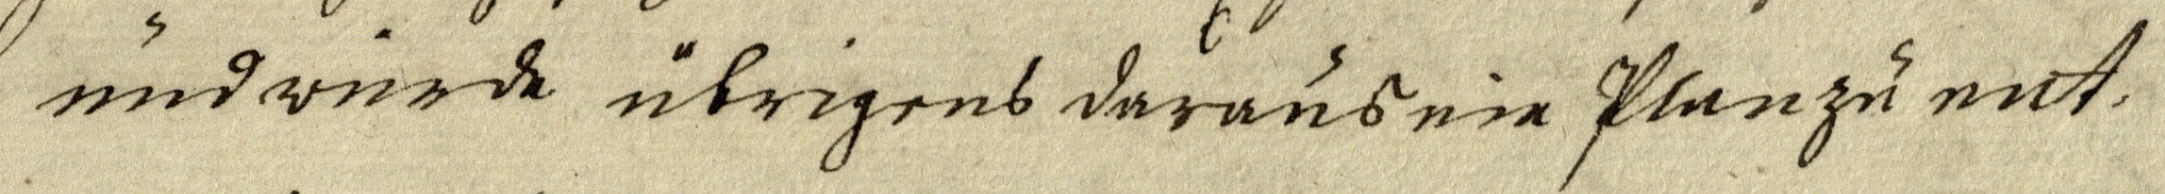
und würde übrigens daraus ein Plan zu ent¬
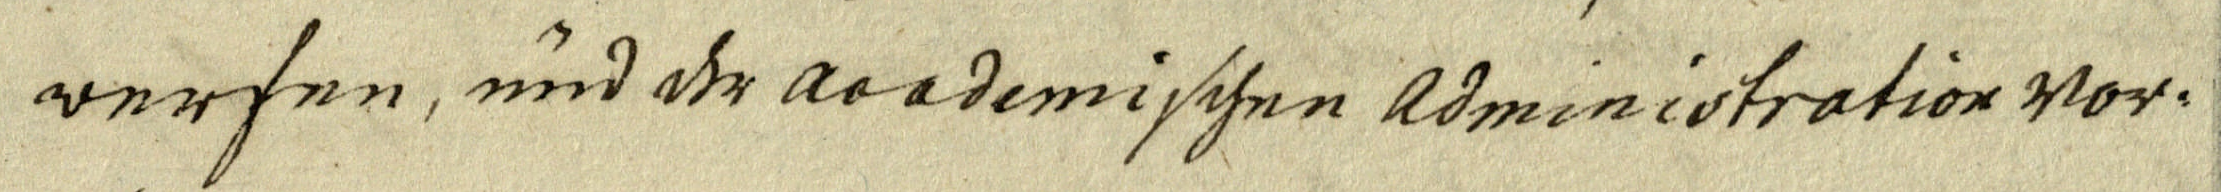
werfen, und der Academischen Administration vor¬
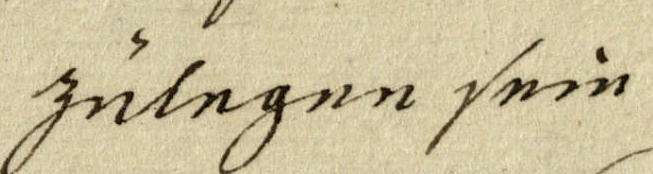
zulegen sein.
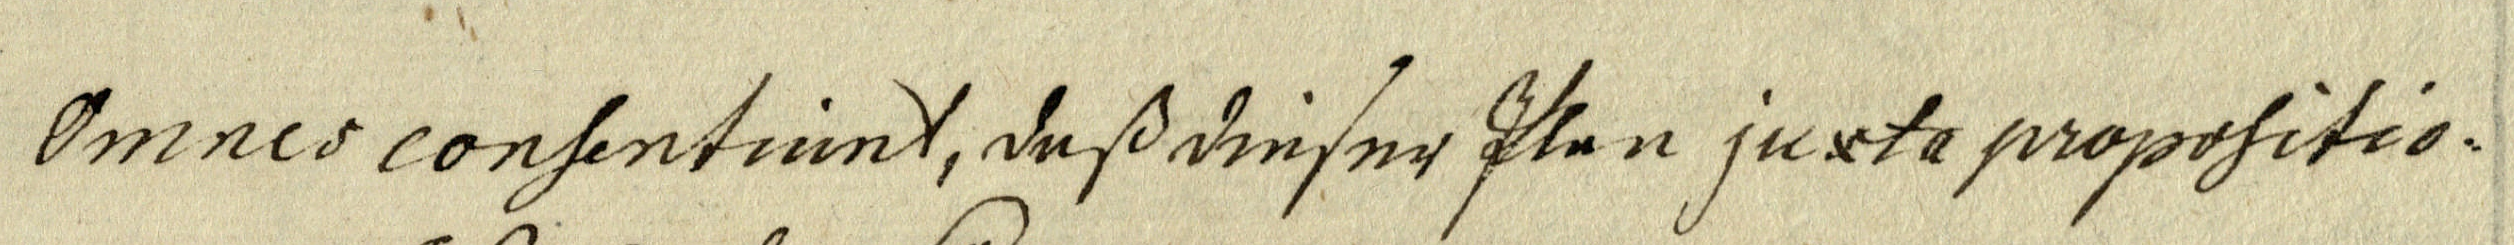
Omnes consentiunt, daß dieser Plan juxta propositio¬
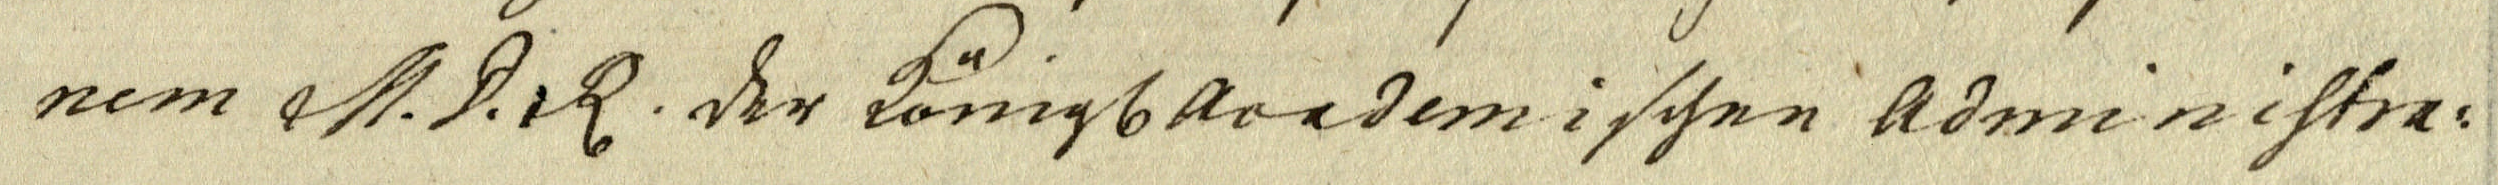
nem M. D. R. der Königl. Academischen Administra¬
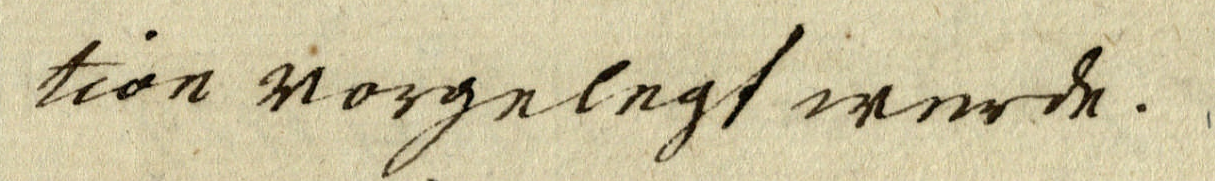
tion vorgelegt werde.
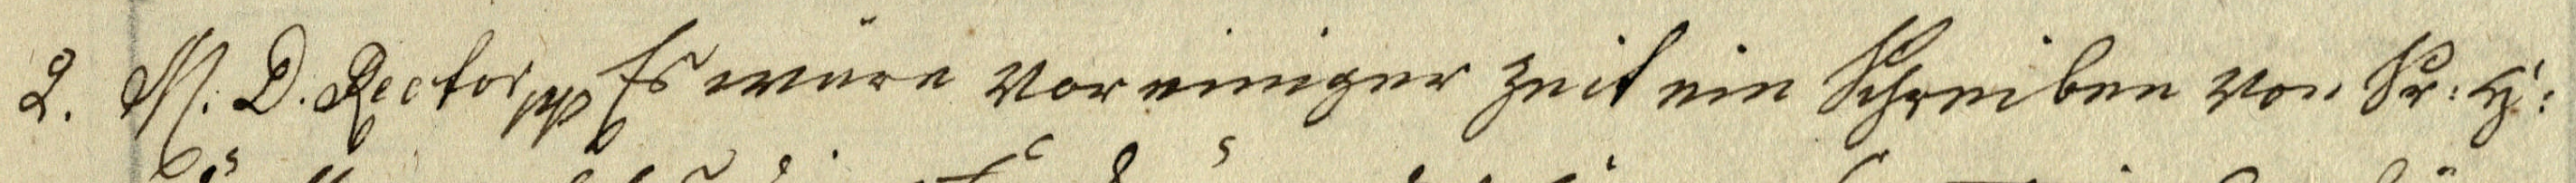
2. M. D. Rector pp. Es wäre vor einiger Zeit ein Schreiben von Sr H.
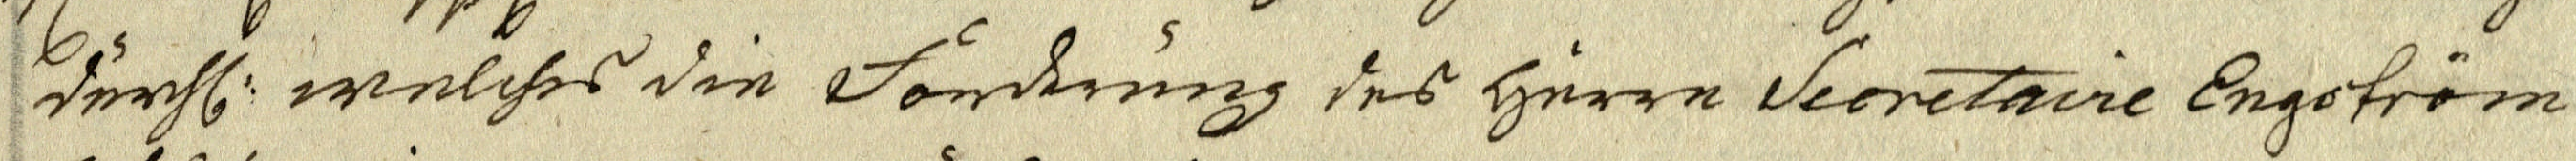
durchl welches die Forderung des Herrn Secretaire Engström
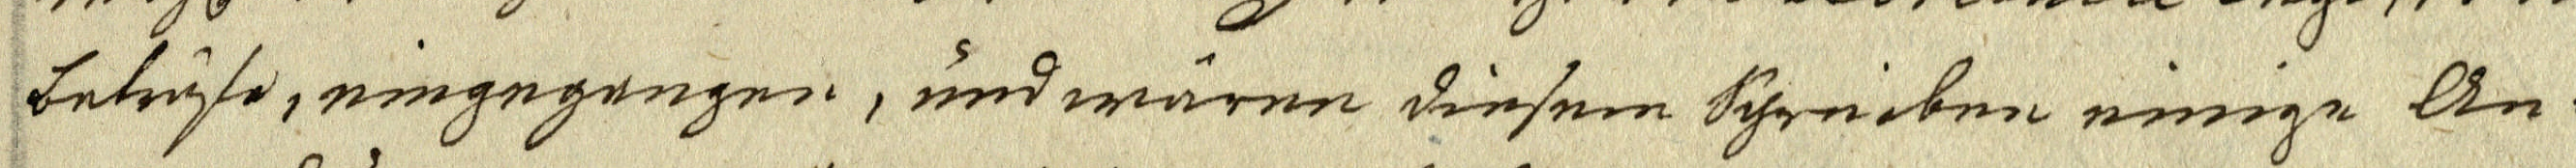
beträfe, eingegangen und wären diesem Schreiben einige An¬
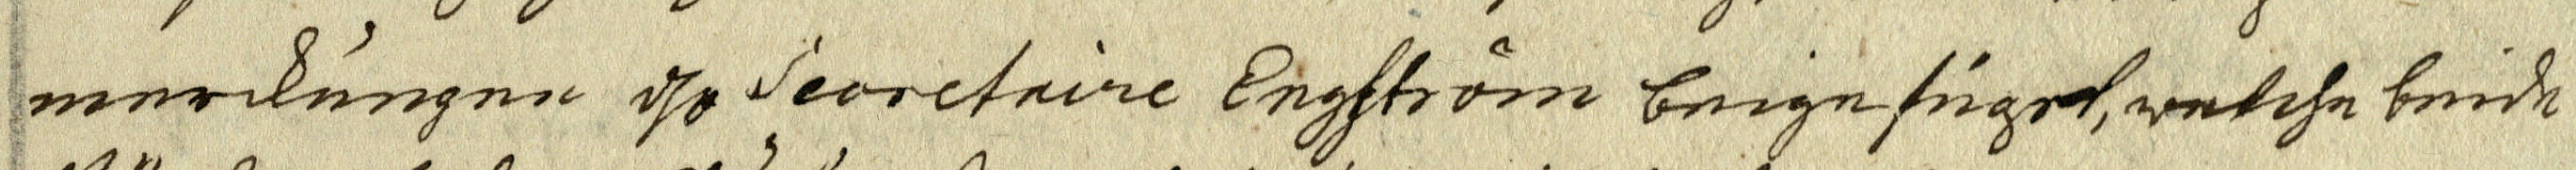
merckungen dh Secretaire Engström beigefüget, welche beide
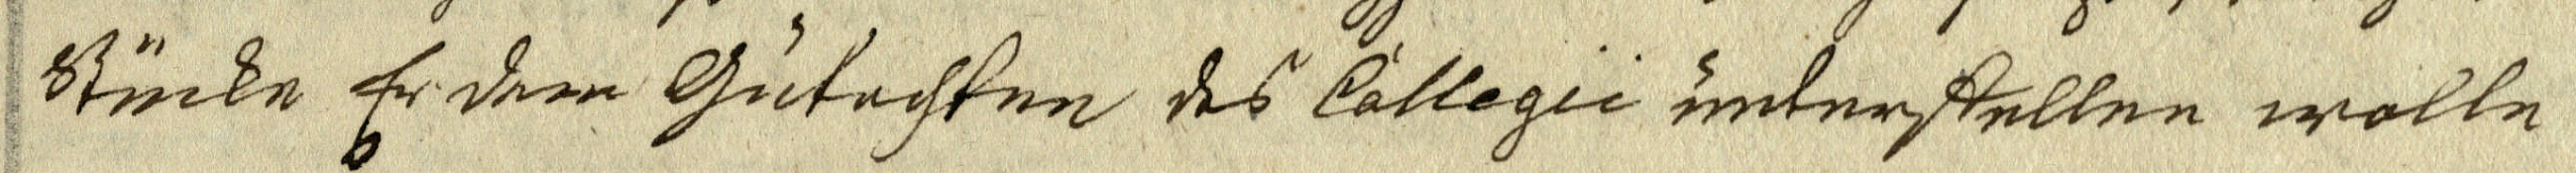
Stücke Er dem Gutachten des Collegii unterstellen wolle.
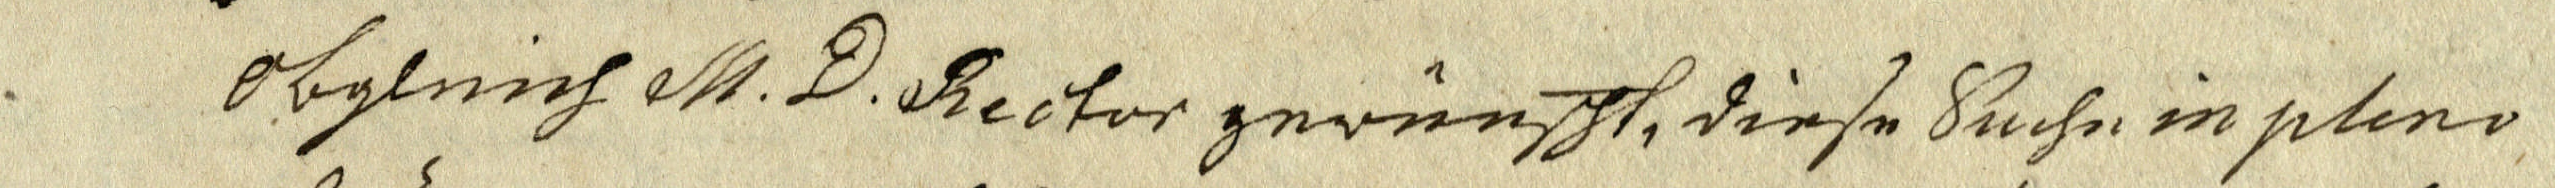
Obgleich M. D. Rector gewünscht, diese Sache in pleno
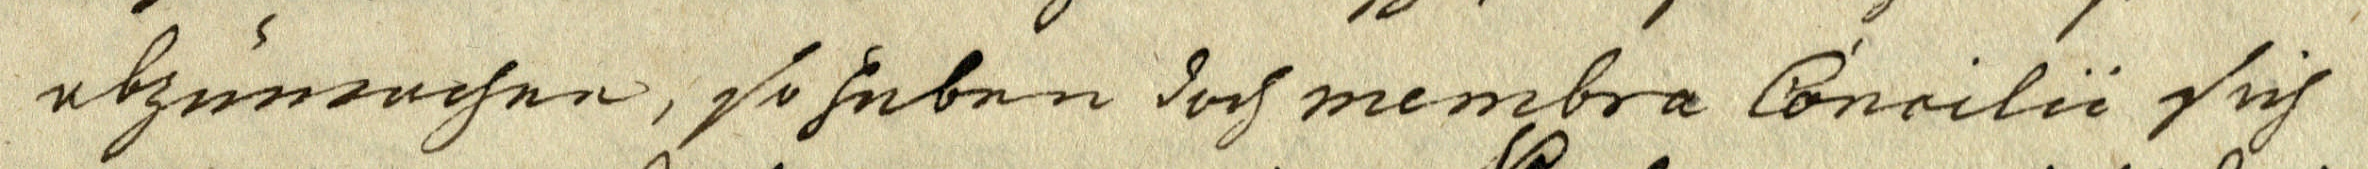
abzumachen, so haben doch membra Concilii sich
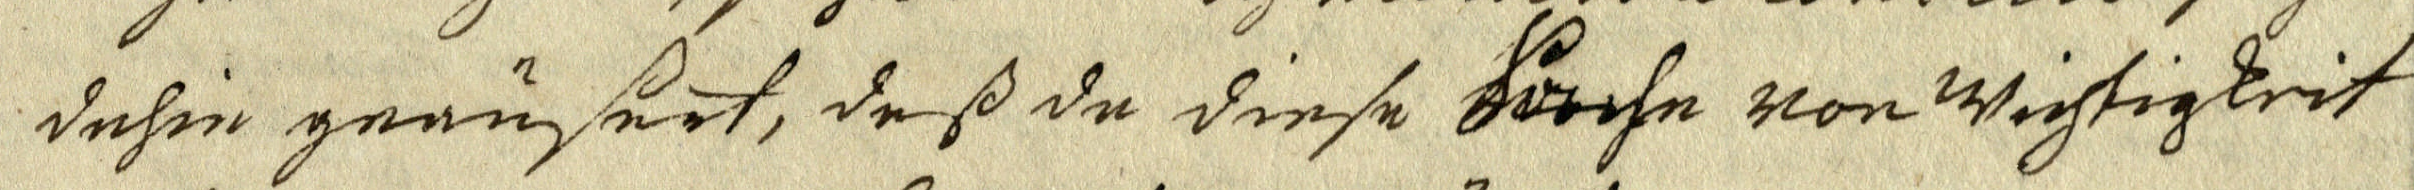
dahin geäußert, daß da diese Sache von Wichtigkeit
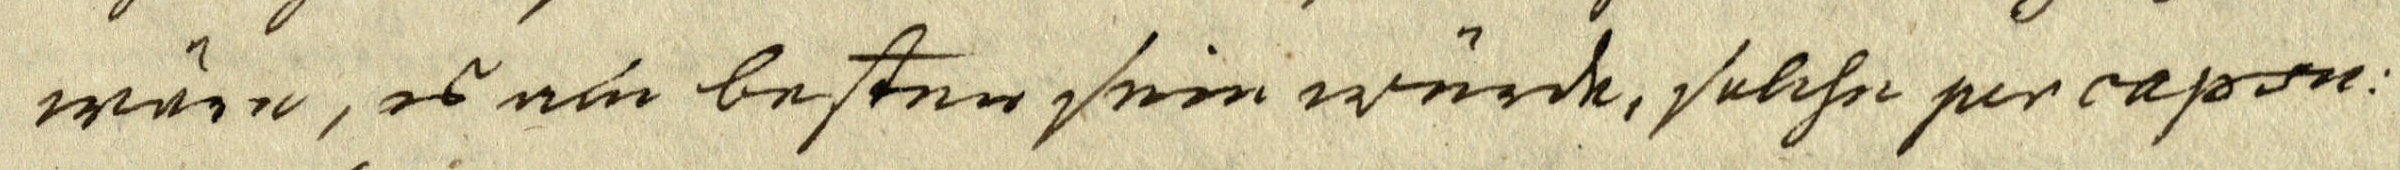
wäre, es am besten sein würde, solche per capsu¬
